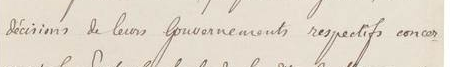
décisions de leurs Gouvernements respectifs concer-
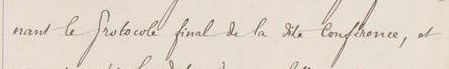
nant le Protocole final de la dite Conférence, et
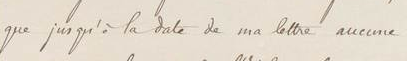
que jusqu'à la date de ma lettre aucune
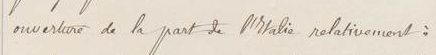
ouverture de la part de l'Italie relativement à
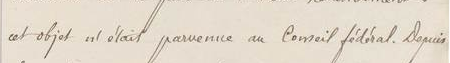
cet objet n'était parvenue au Conseil fédéral. Depuis
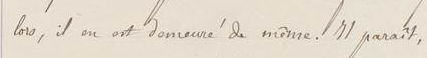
lors, il en est demeuré de même. Il paraît,
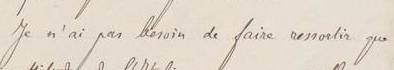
Je n'ai pas besoin de faire ressortir que
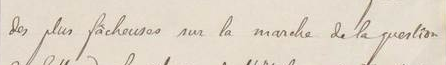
des plus fâcheuses sur la marche de la question
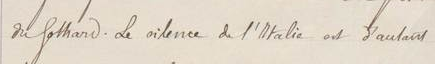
du Gothard. Le silence de l'Italie est d'autant
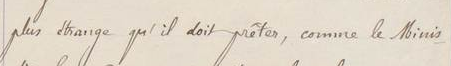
plus étrange qu'il doit prêter, comme le Minis-
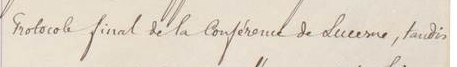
Protocole final de la Conférence de Lucerne, tandis
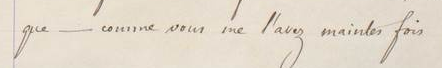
que – comme vous me l'avez maintes fois
